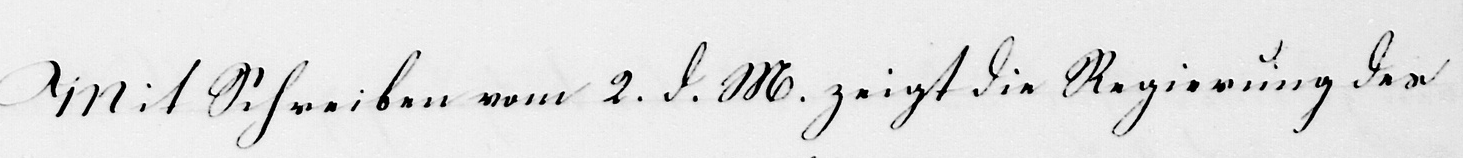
Mit Schreiben vom 2. d. M. zeigt die Regierung des
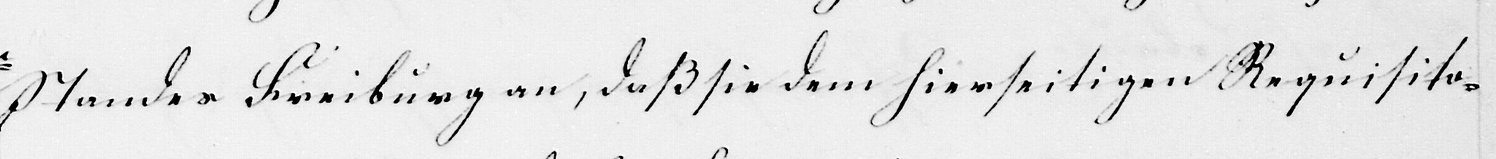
Standes Freiburg an, daß sie dem hierseitigen Requisito¬
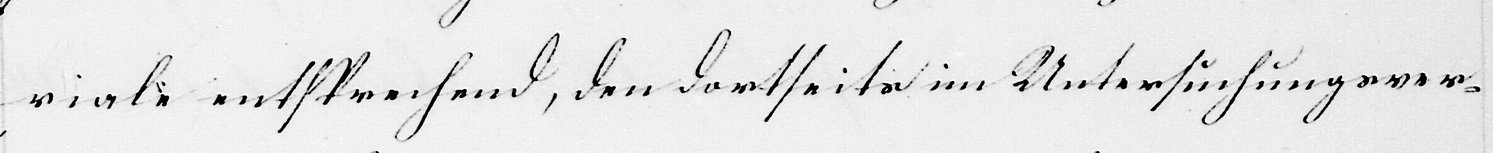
riale entsprechend, den dortseits im Untersuchungsver¬
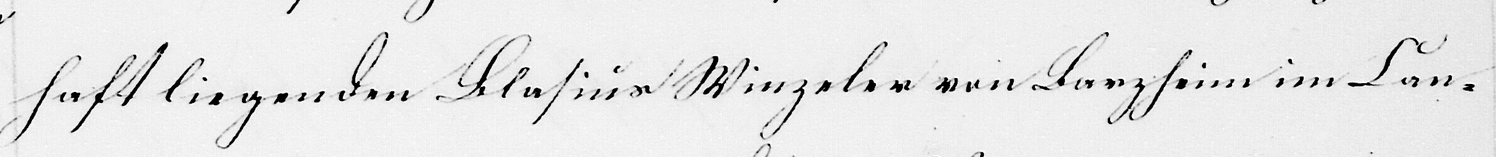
haft liegenden Blasius Winzeler von Barzheim im Can¬
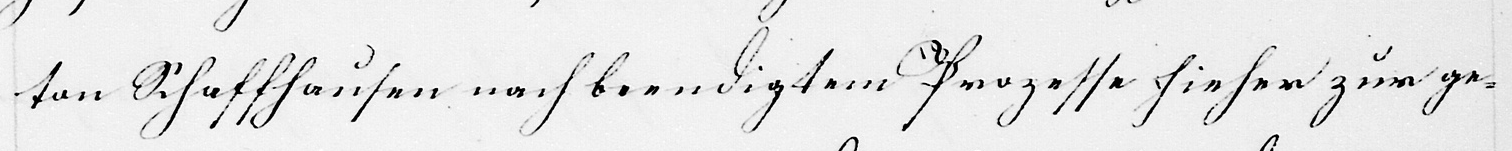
ton Schaffhausen nach beendigtem Prozesse hieher zur ge¬
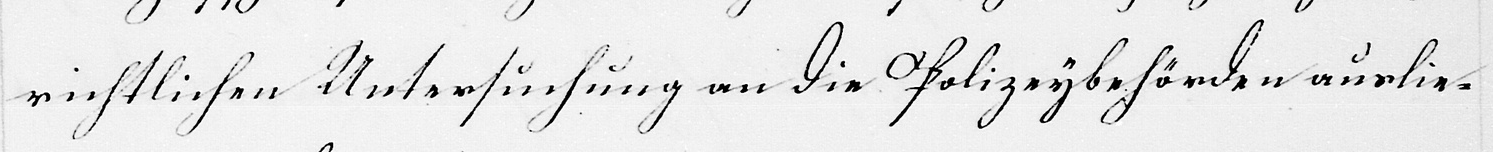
richtlichen Untersuchung an die Polizeybehörden auslie¬
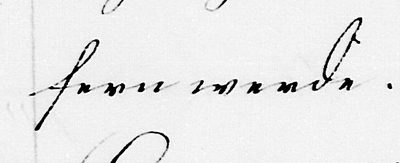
fern werde.
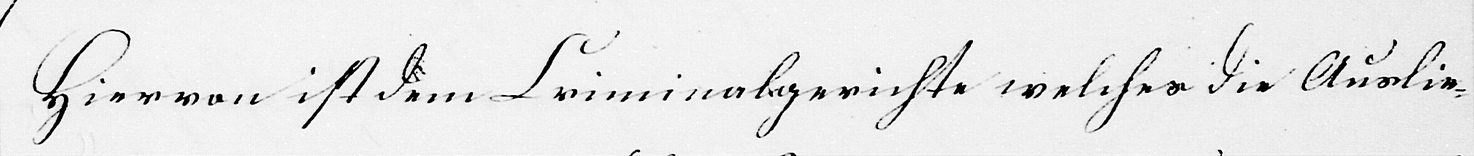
Hiervon ist dem Criminalgerichte welches die Auslie¬
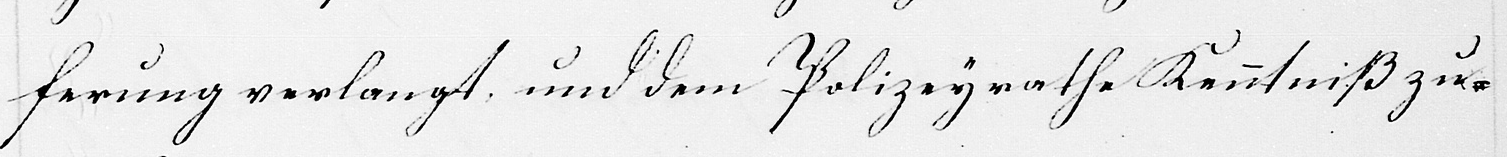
ferung verlangt, und dem Polizeyrathe Kenntniß zu
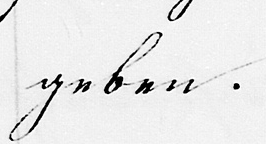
geben.
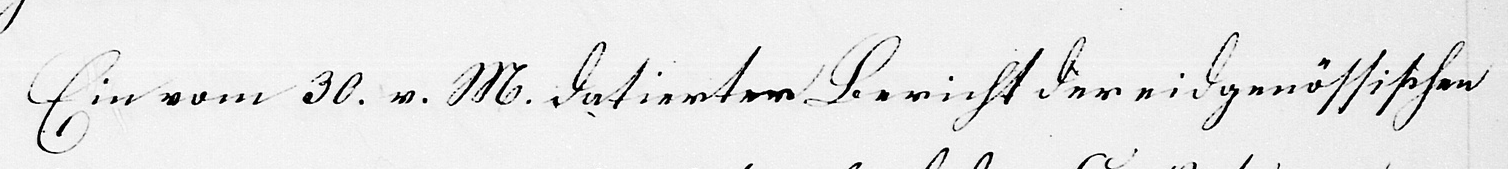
Ein vom 30. v. M. datierter Bericht der eidgenössischen
